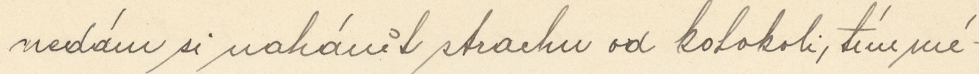nedám si nahánět strachu od kohokoli, tím mé-
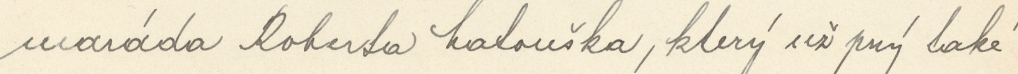maráda Roberta Matouška, který už prý také
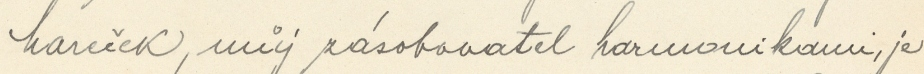Mareček, můj zásobovatel harmonikami, je
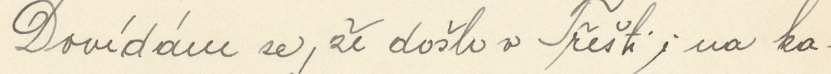Dovídám se, že došlo v Třešti i na ka-
